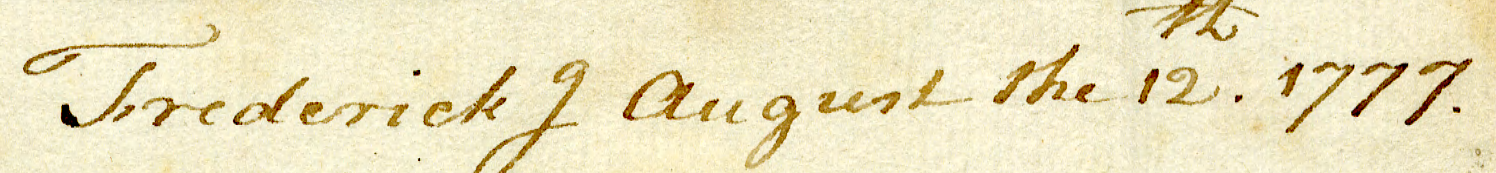Frederick^g August the 12^th. 1777.
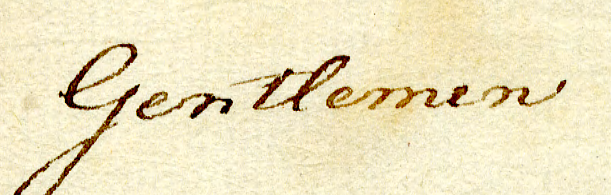Gentlemen
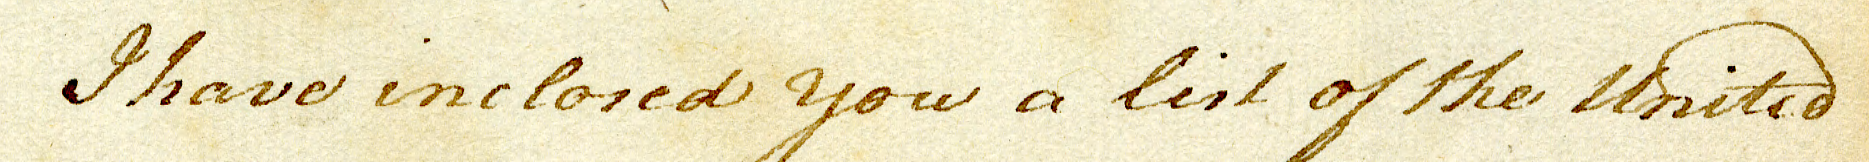I have inclosed you a list of the United
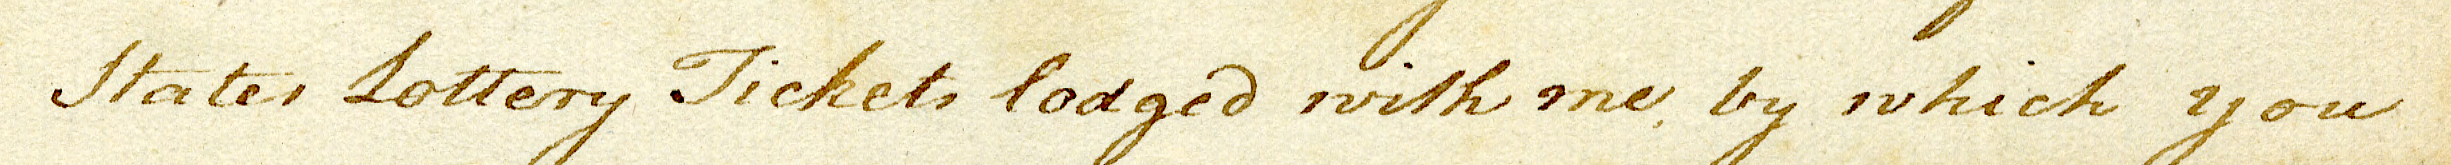States Lottery Tickets lodged with me by which you
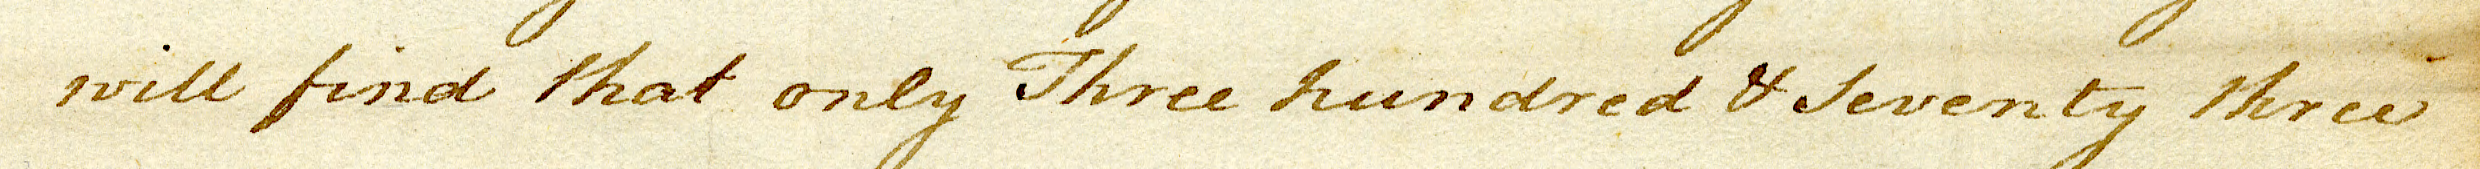will find that only Three hundred & seventy three
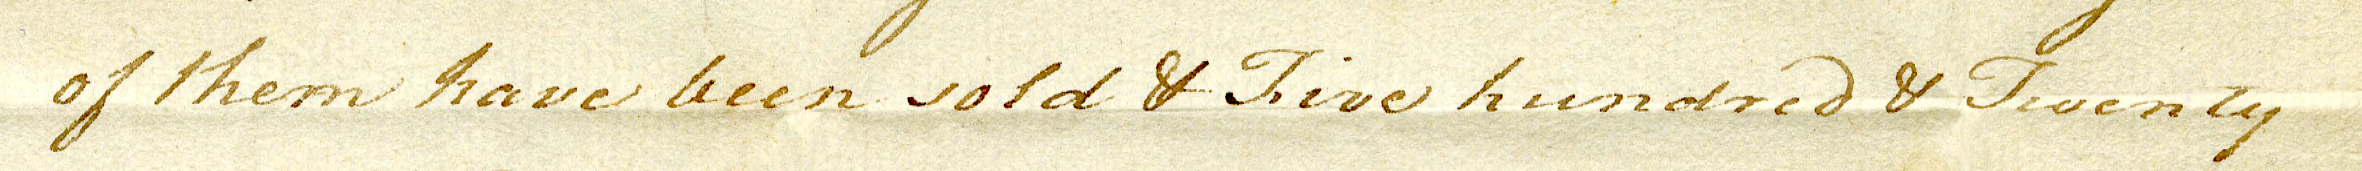of them have been sold & Five hundred & Twenty
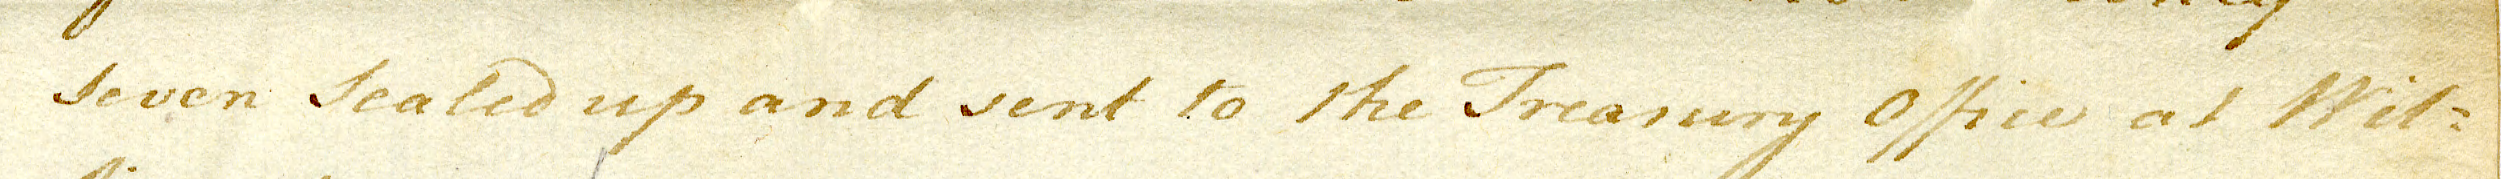seven sealed up and send to the Treasury Office at Wil-
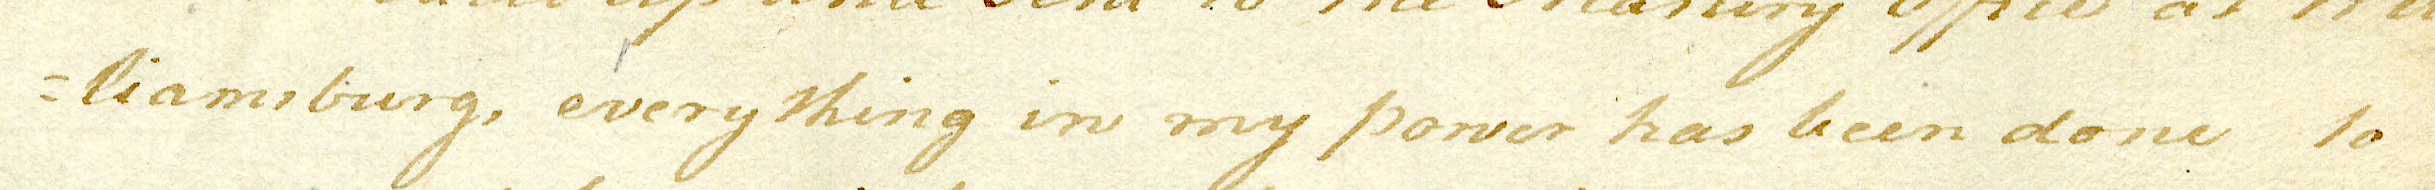-liamsburg, everything in my power has been done to
